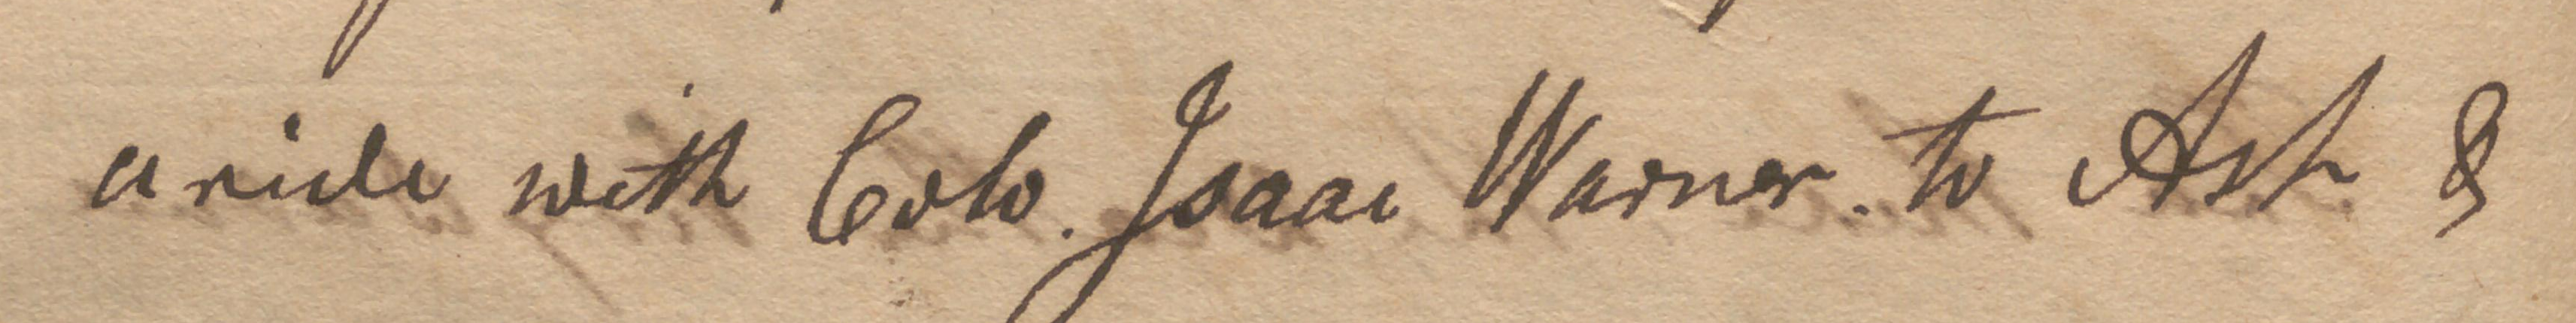a ride with Colo. Isaac Warner. to Ash &
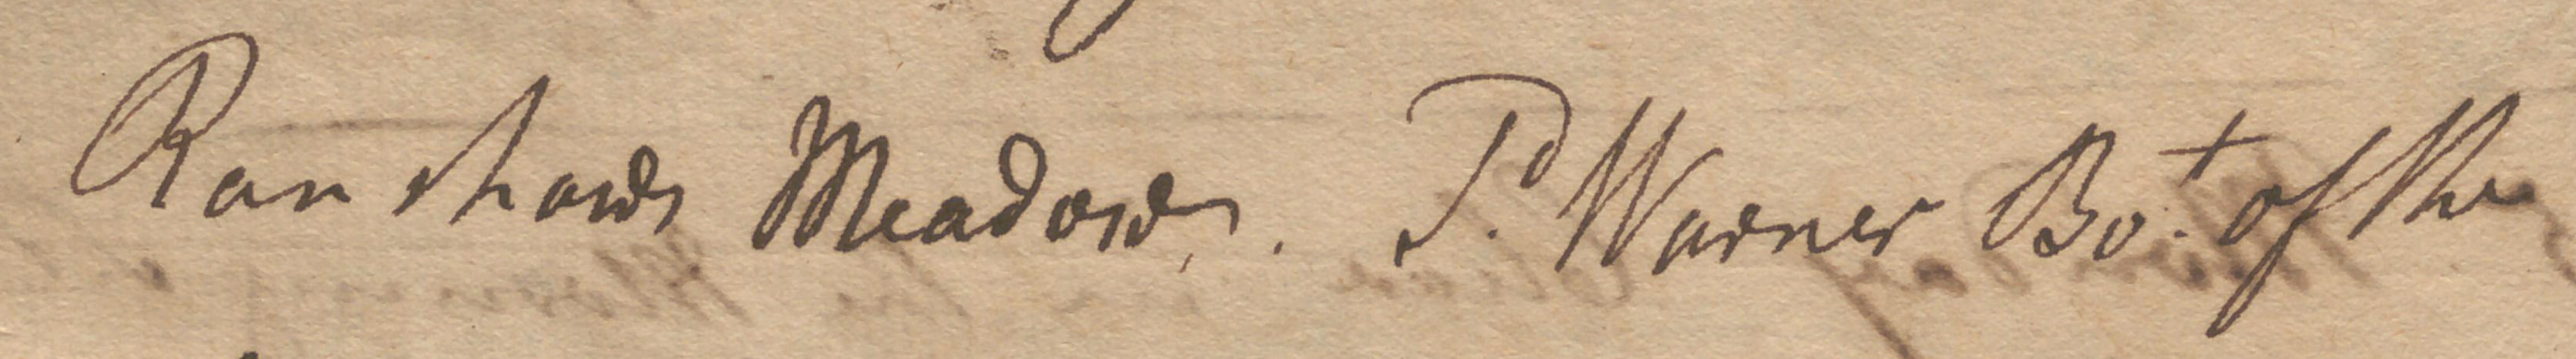Ranshaws Meadow. s^d P Warner Bo^t. of the
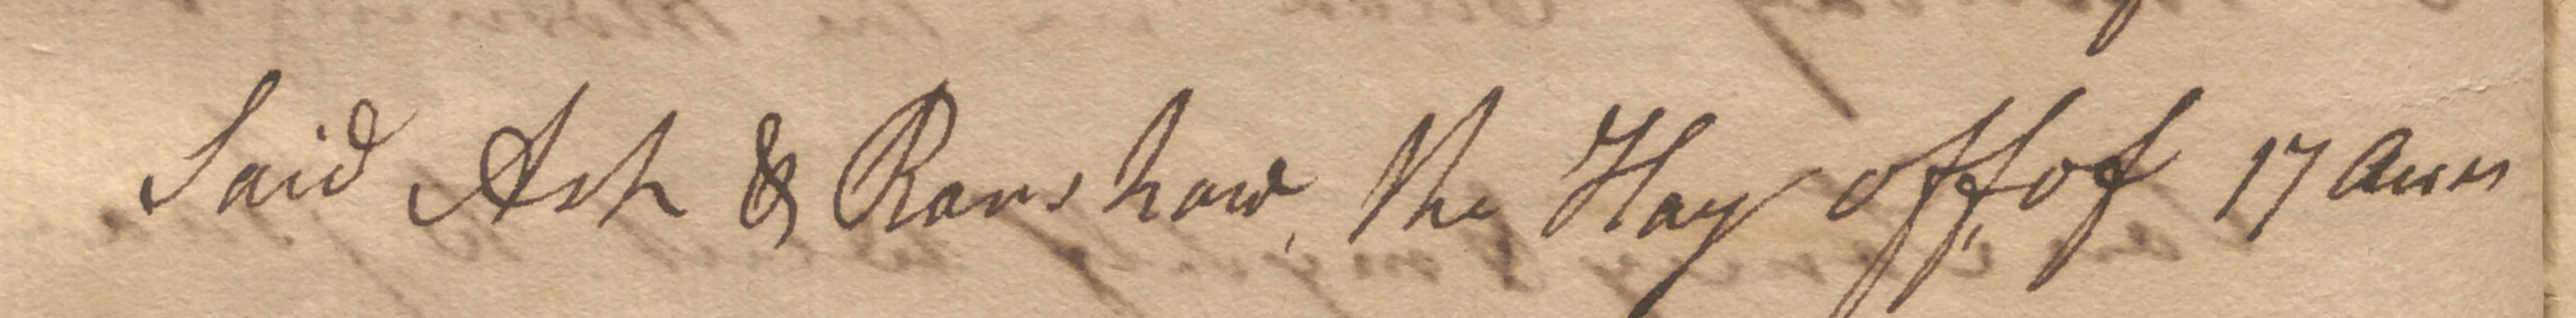Said Ash & Ranshaw the Hay off of 17 acres
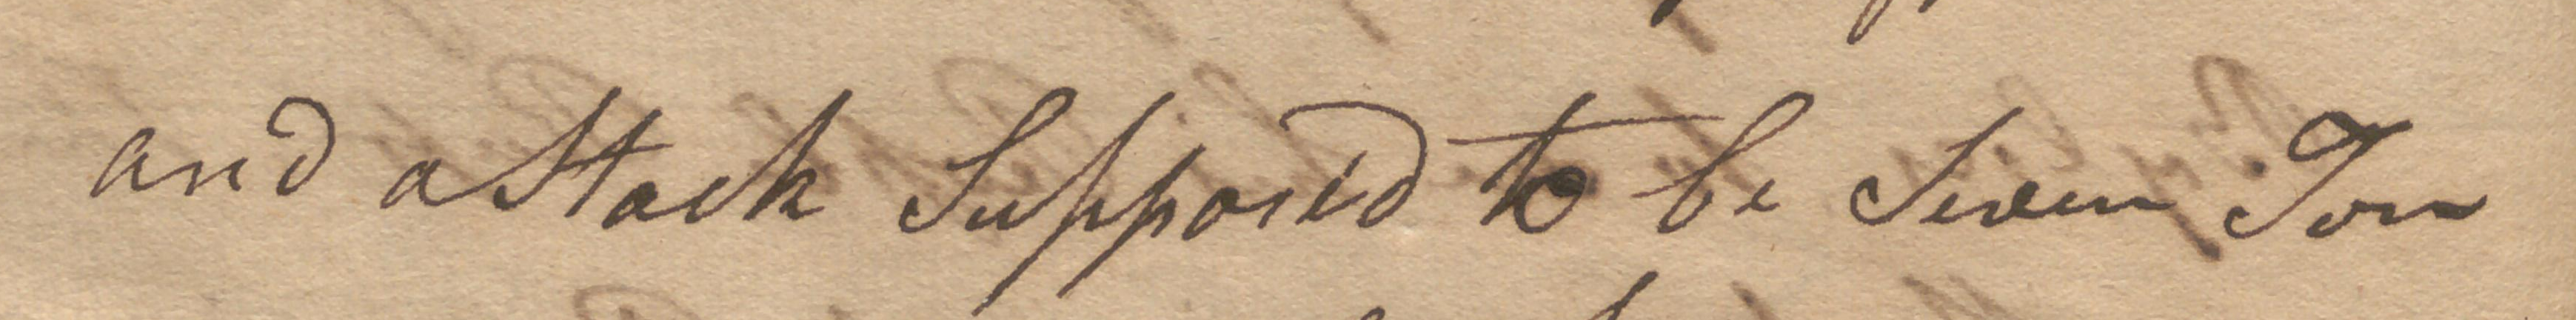and a Stack Suppostd to be Seven Ton
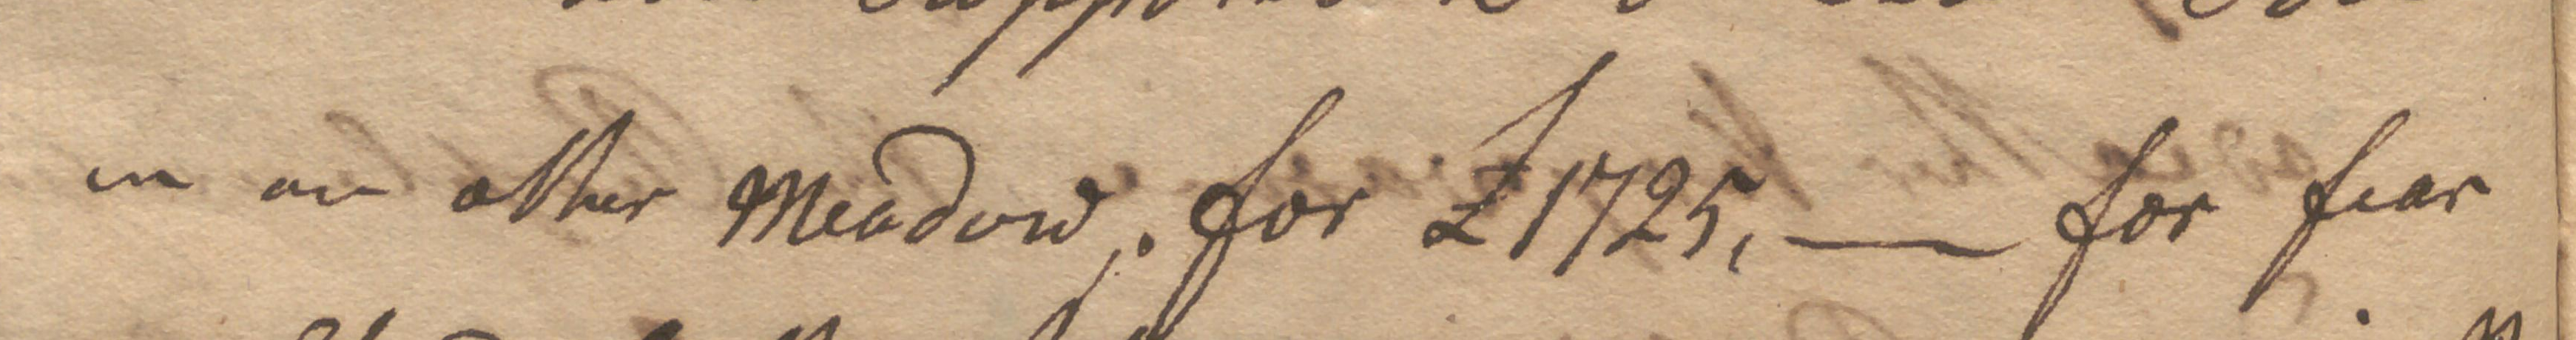in an other Meedow, for £1725.- for fear
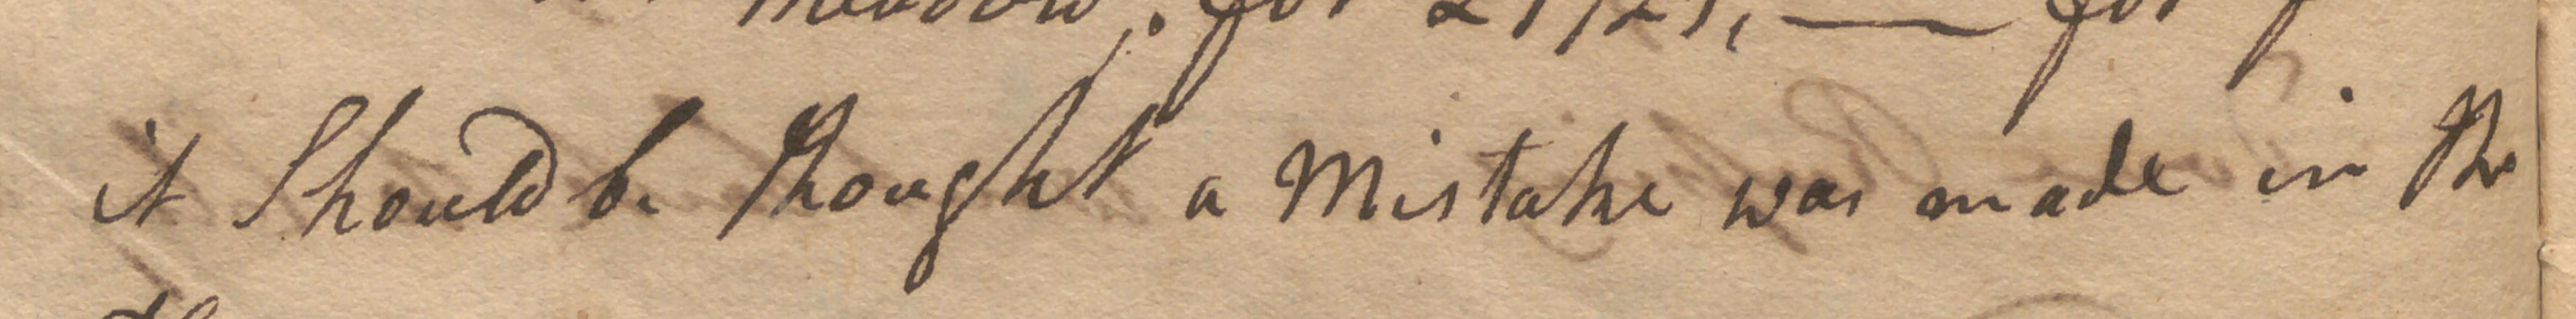it Should be thought a Mistake was made in the
